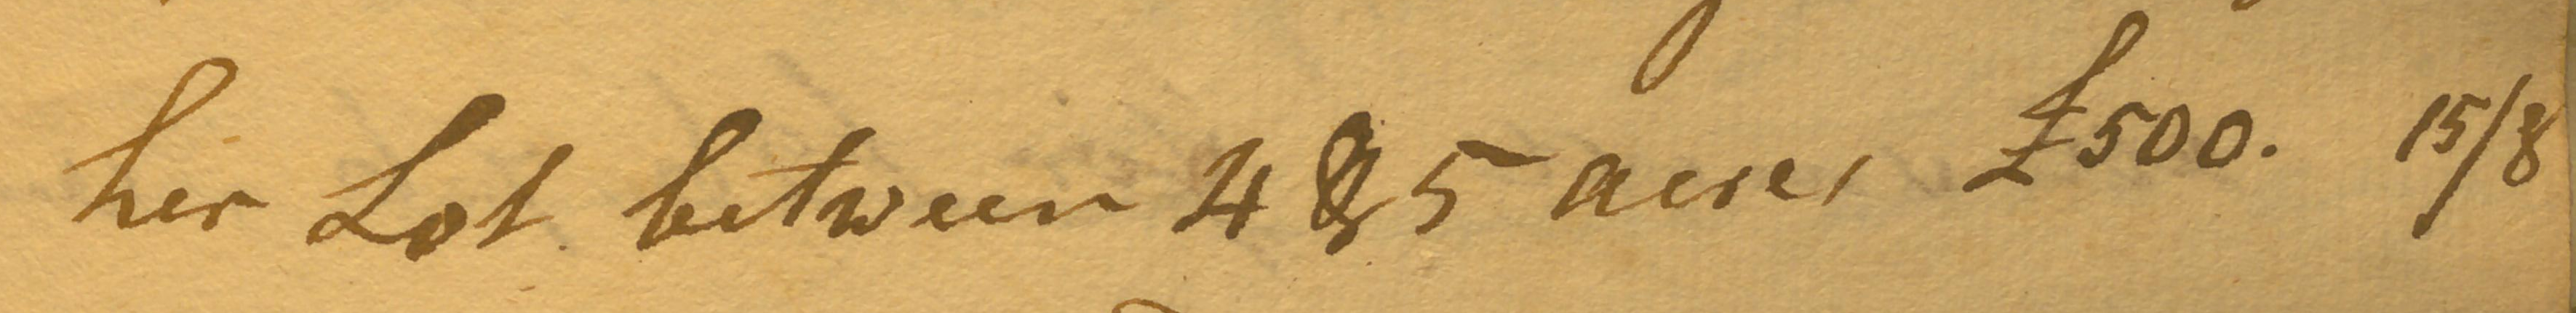her Lot. between 4 & 5 acses £500. 15s8
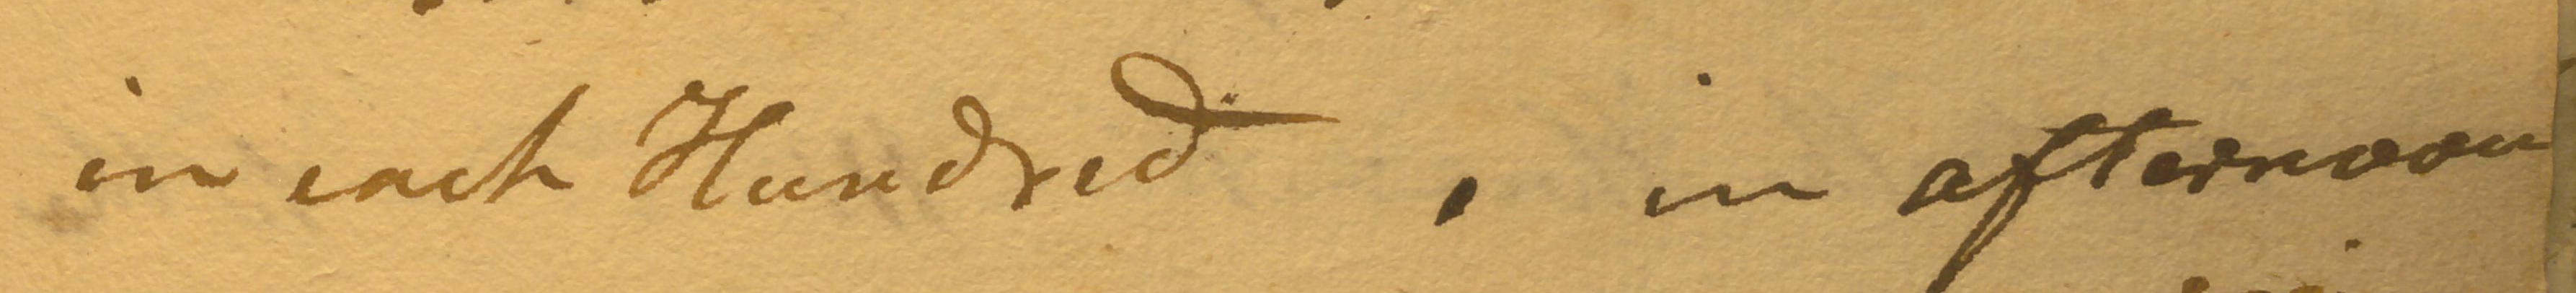in each Hundred, in afternoon
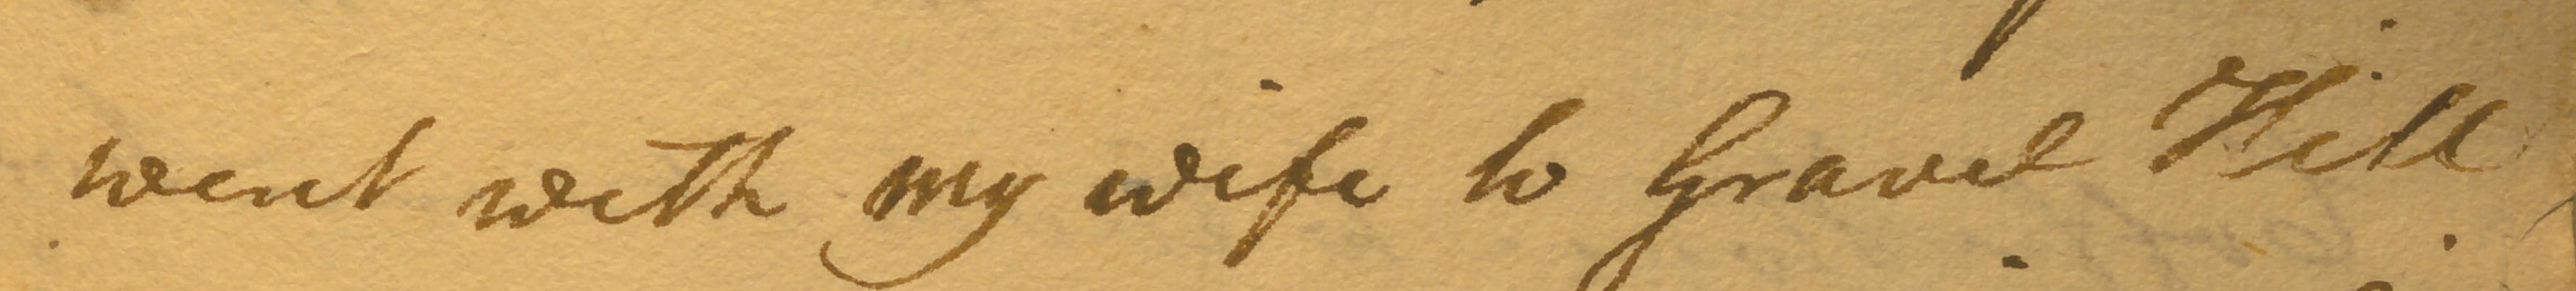went with my wife to Gravel Hill
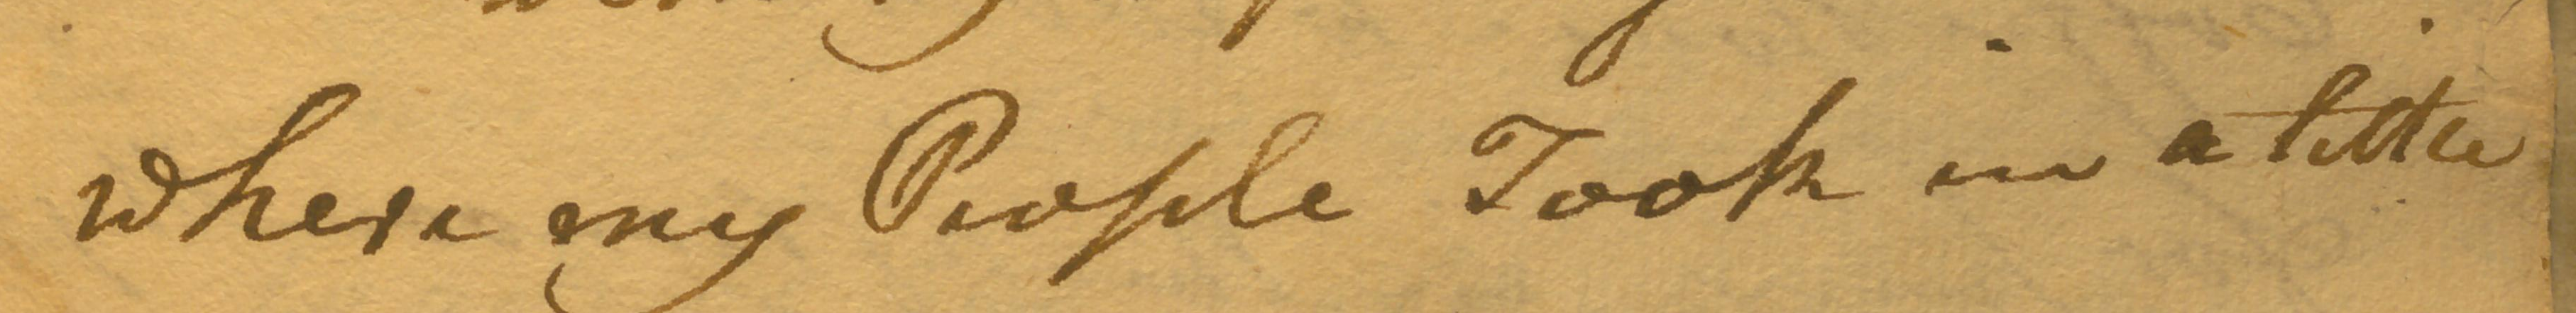whese my People Took in a little
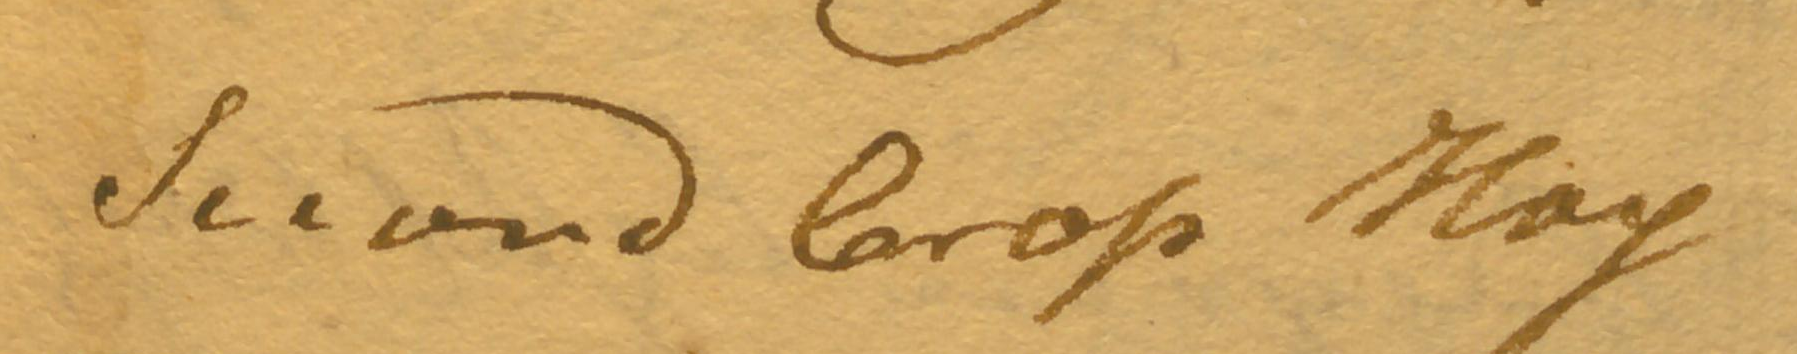second Crop Hay
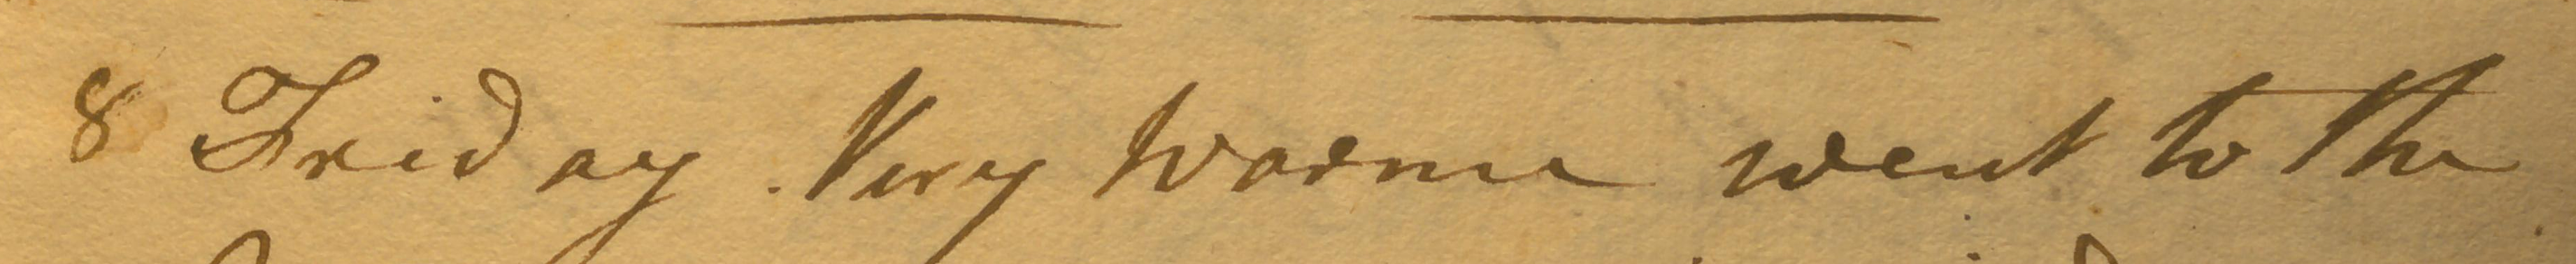8 Friday Very warme went to the
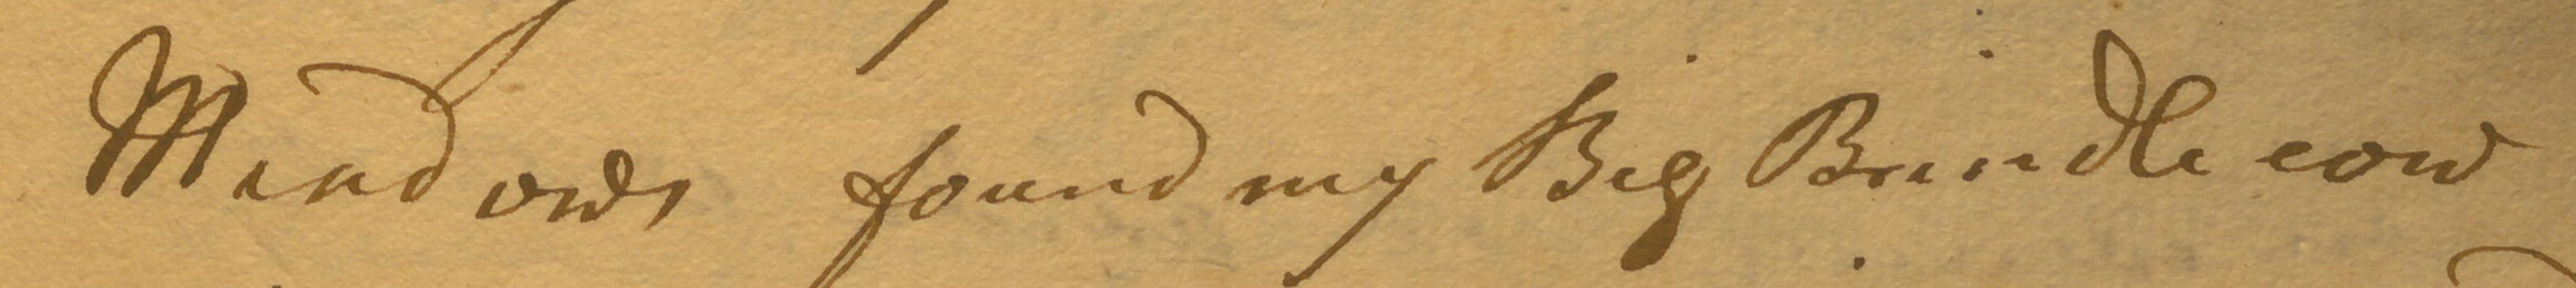Meadows found my Big Brindle cow
